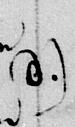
d.)
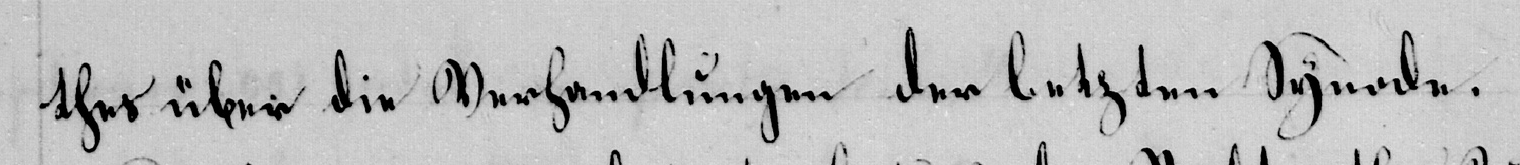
thes über die Verhandlungen der letzten Synode.
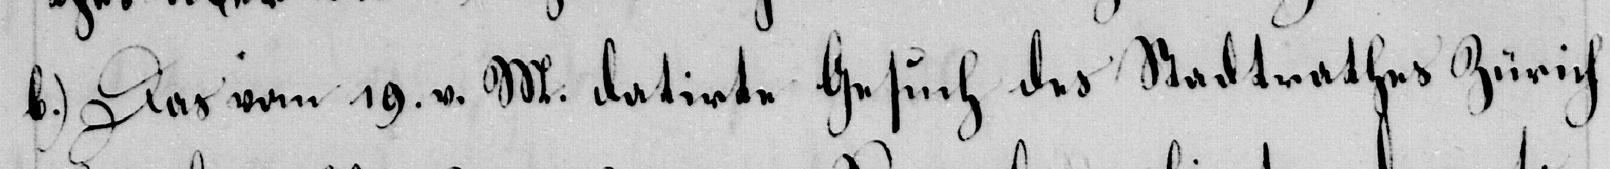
b.) Das vom 19. v. M. datirte Gesuch des Stadtrathes Zürich
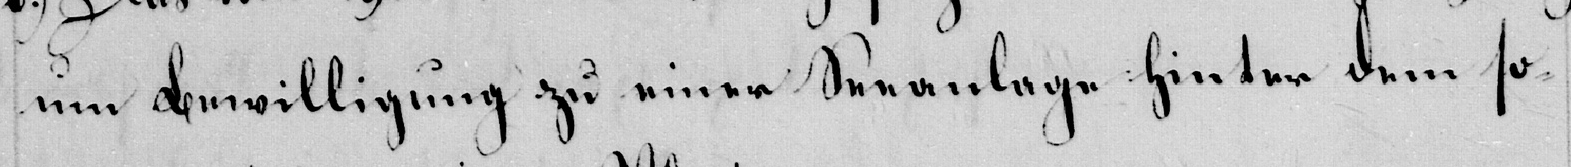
um Bewilligung zu einer Seeanlage hinter dem so¬
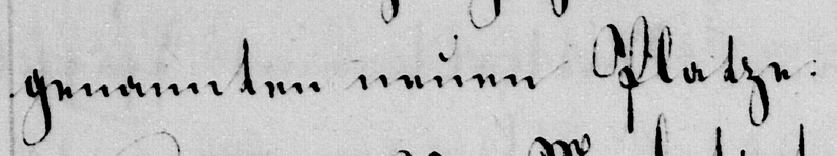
genannten neuen Platze.
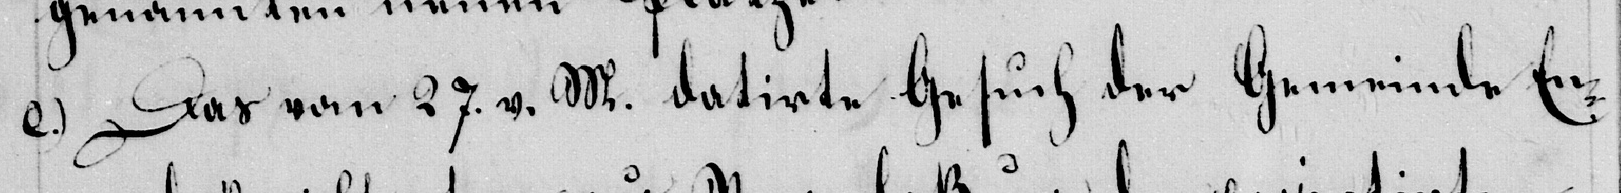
c.) Das vom 27. v. M. datirte Gesuch der Gemeinde En¬
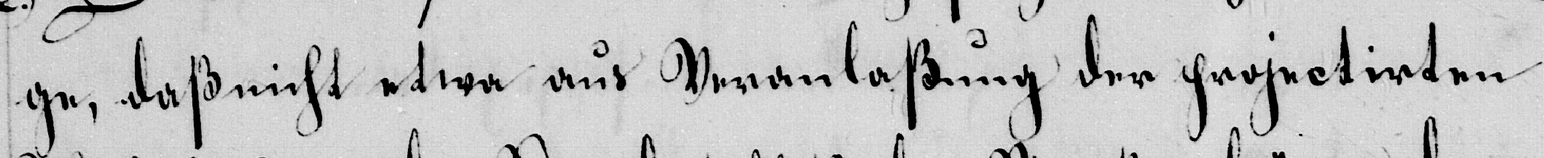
ge, daß nicht etwa aus Veranlaßung der projectirten
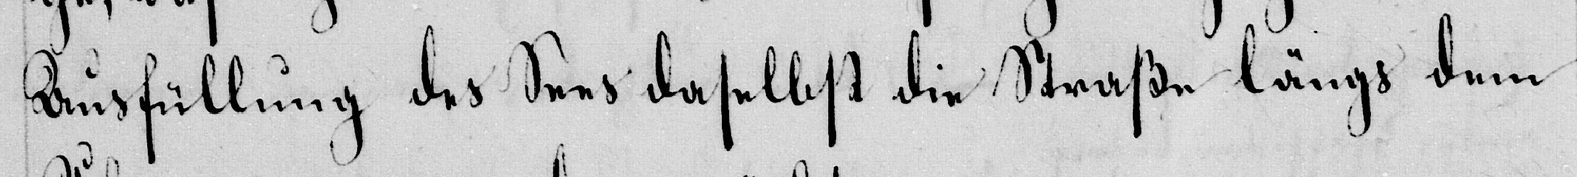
Ausfüllung des Sees daselbst die Straße längs dem
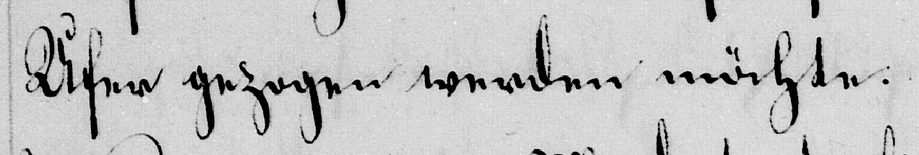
Ufer gezogen werden möchte.
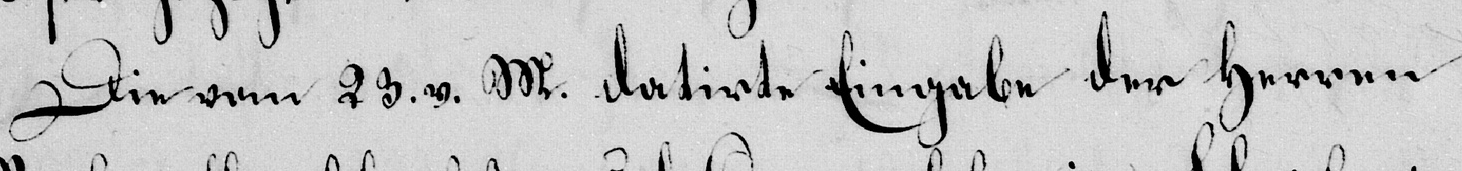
Die vom 23. v. M. datirte Eingabe der Herren
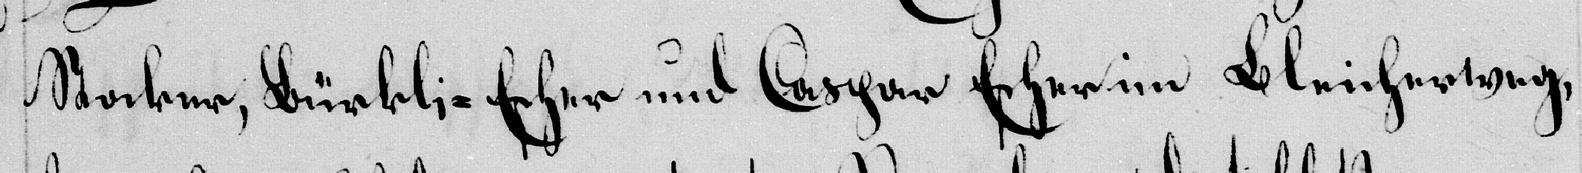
Stocker, Bürkli-Escher und Caspar Escher im Bleicherweg,
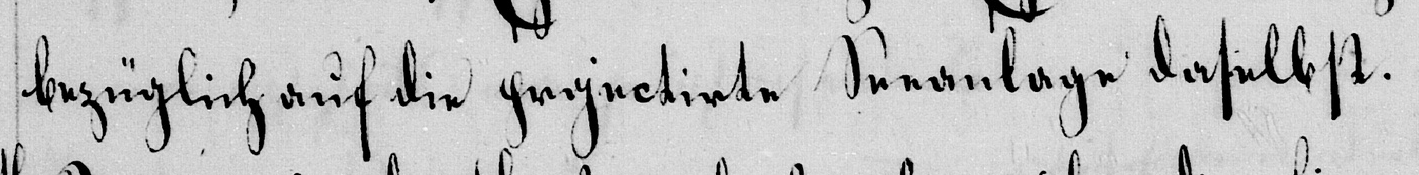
bezüglich auf die projectirte Seeanlage daselbst.
